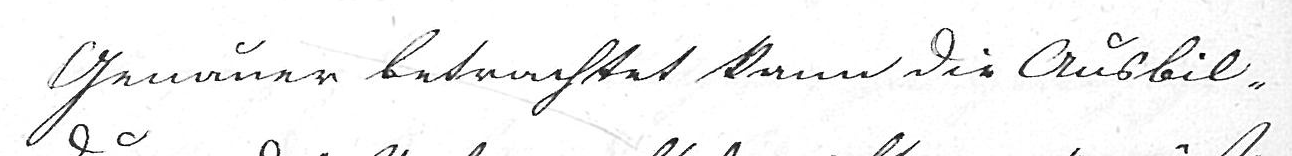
Genauer betrachtet kann die Ausbil-
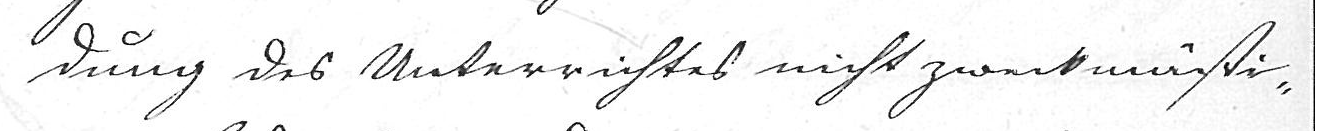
dung des Unterrichtes nicht zweckmäßi-
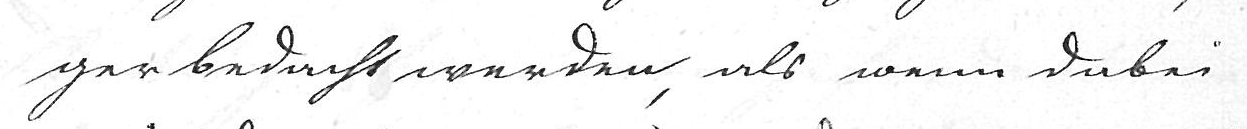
ger bedacht werden, als wenn dabei
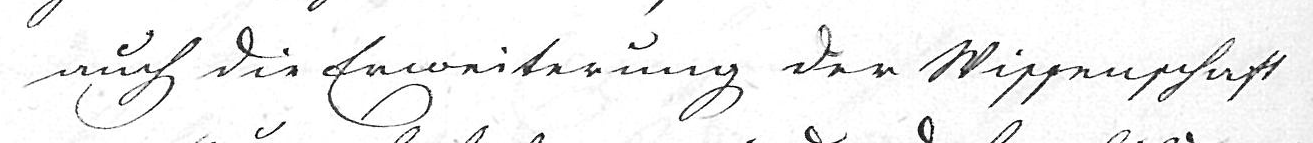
auch die Erweiterung der Wissenschaft
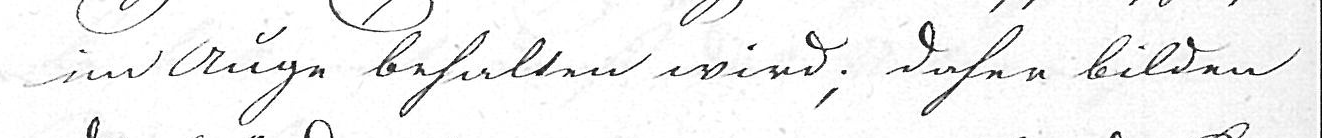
in Auge behalten wird; daher bilden
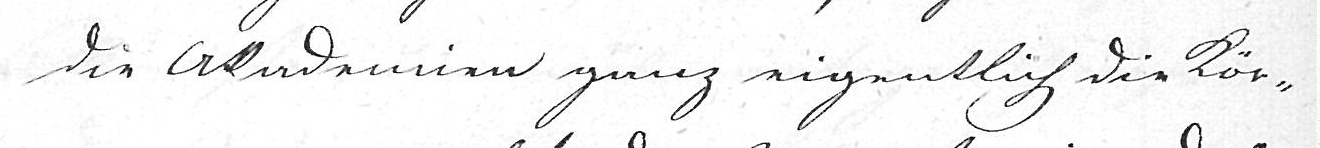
die Akademien ganz eigentlich die Kör-
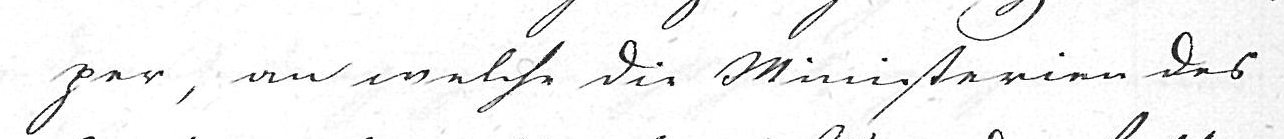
per, an welche die Ministerien des
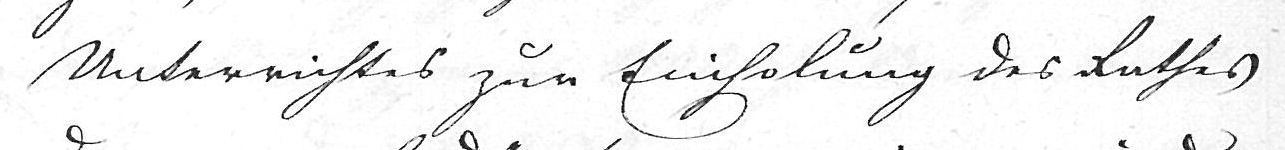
Unterrichtes zur Einholung des Rathes
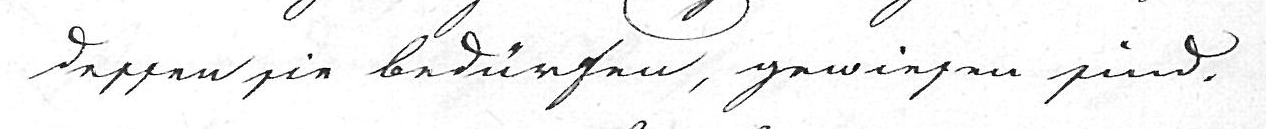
dessen sie bedürfen, gewiesen sind.
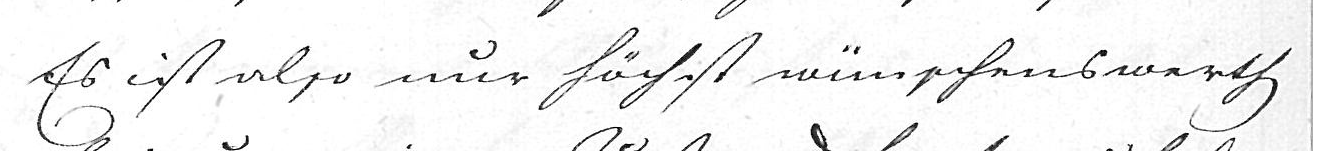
Es ist also nur höchst wünschenswerth
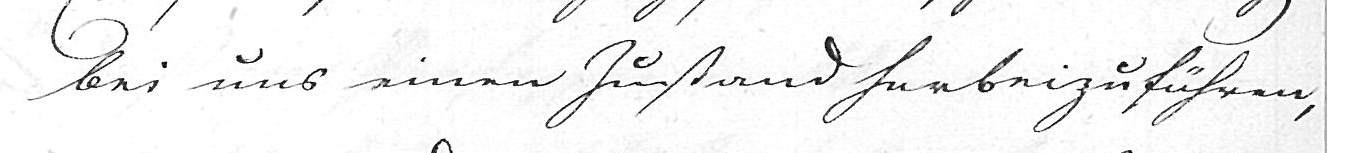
bei uns einen Zustand herbeizuführen,
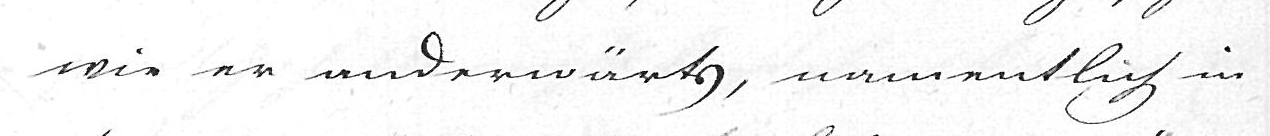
wie er anderwärts, namentlich in
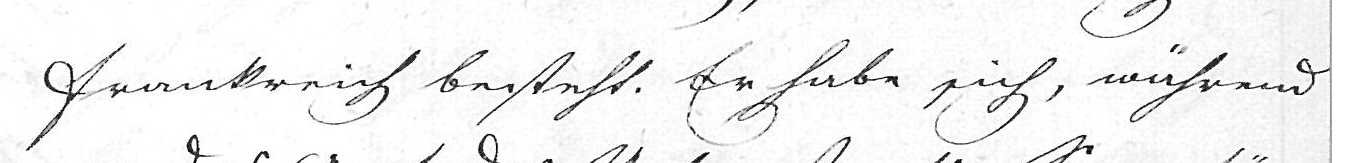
Frankreich besteht. Er habe sich, während
